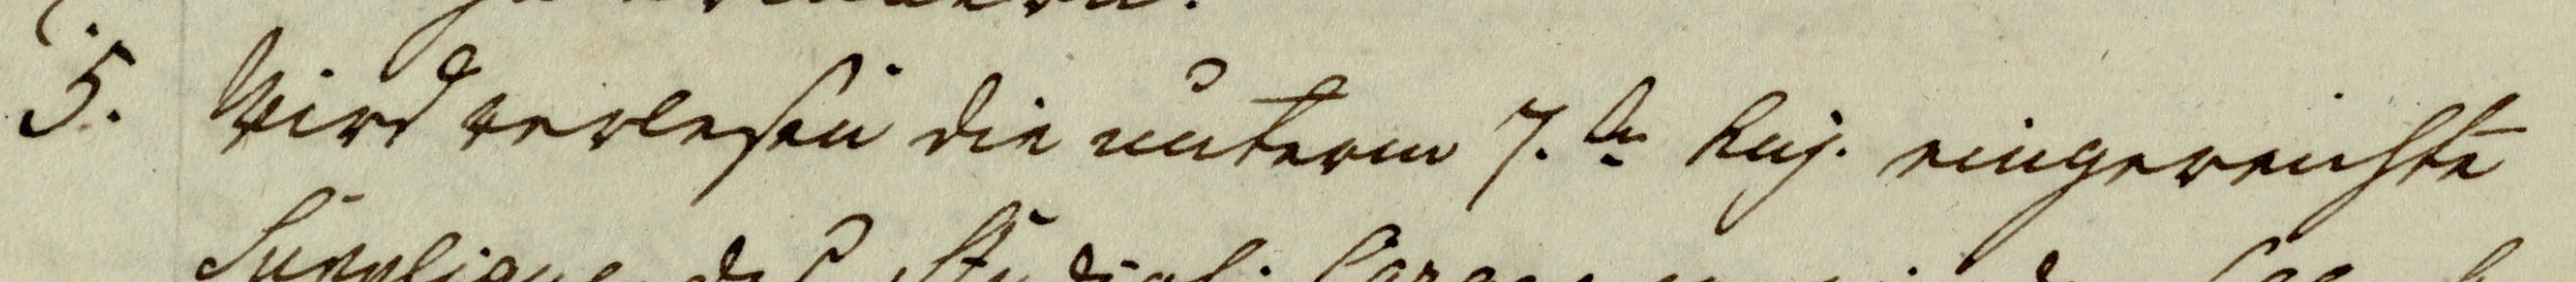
5. Wird verlesen die unterm 7. ten huj. eingereichte
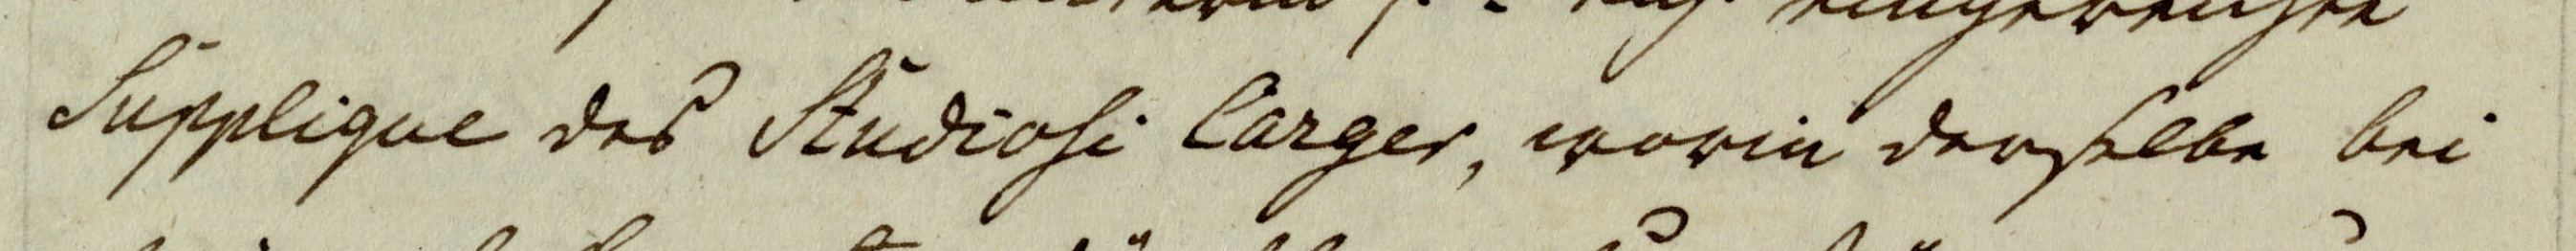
Supplique des Studiosi Carger, worin derselbe bei
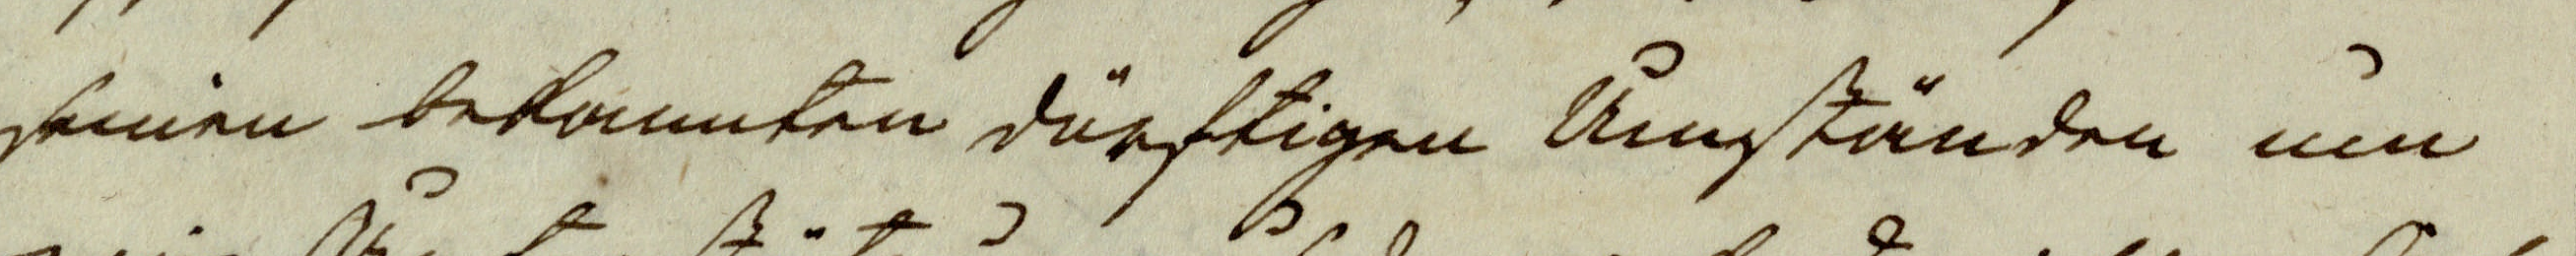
seinen bekannten dürftigen Umständen um
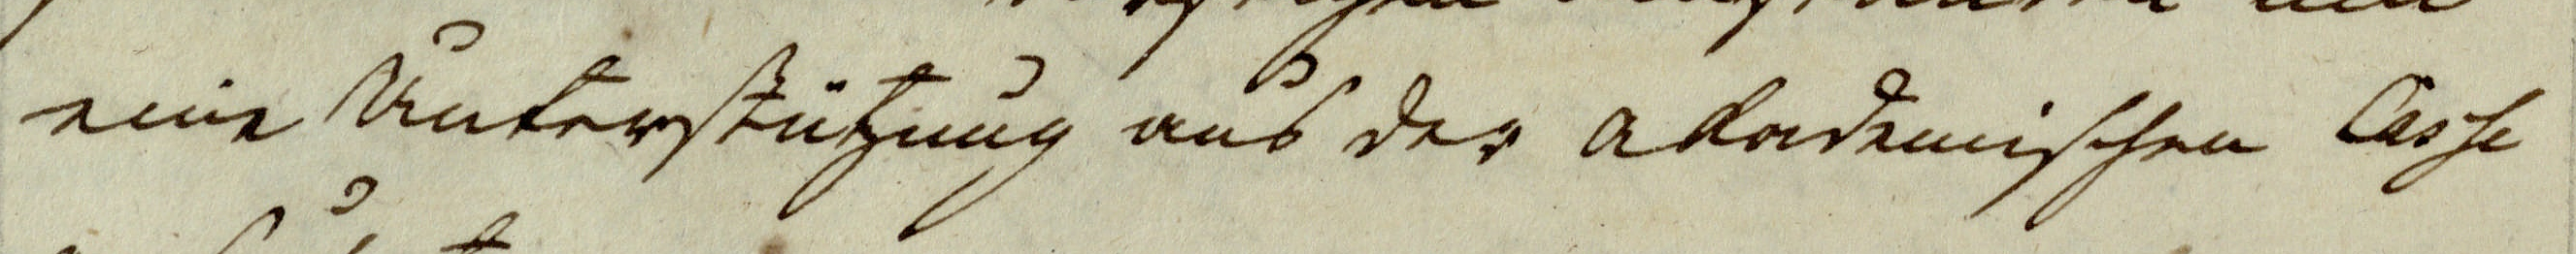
eine Unterstützung aus der akademischen Casse
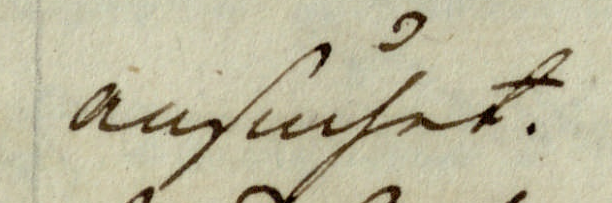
ansuchet.
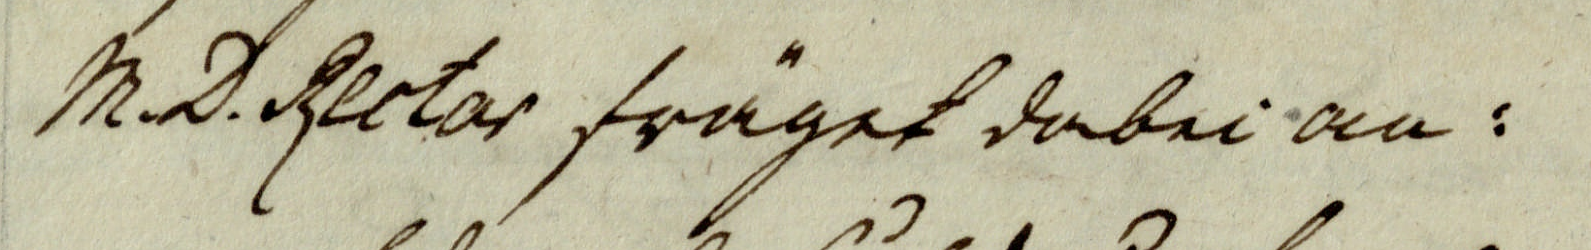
M. D. Rector fräget dabei an:
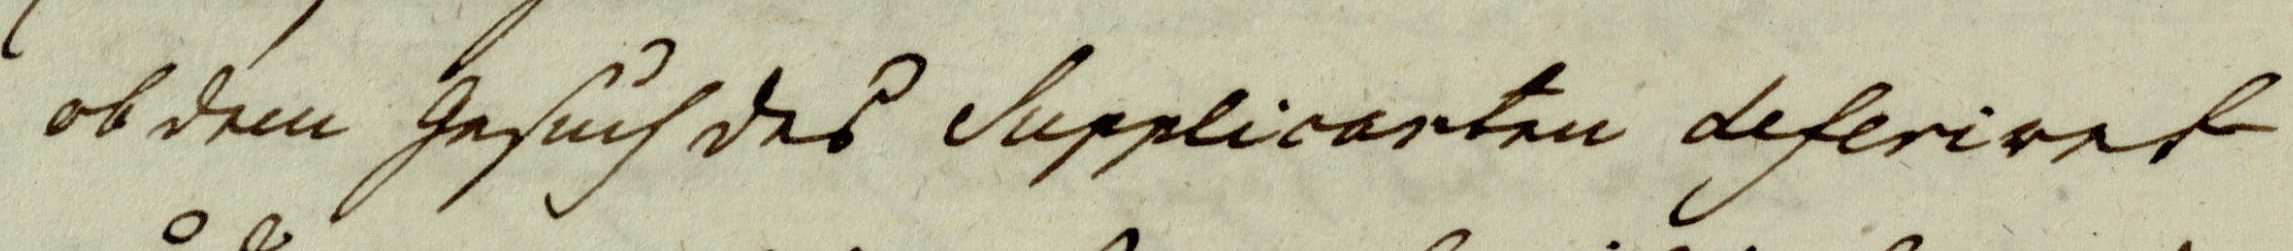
ob dem Gesuch des Supplicanten deferiret
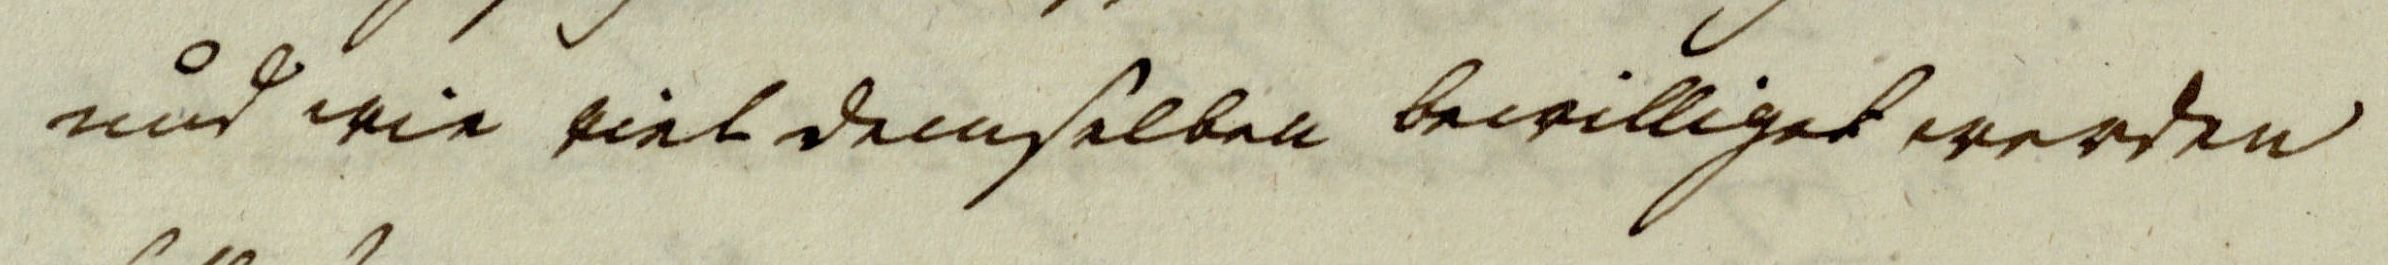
und wie viel demselben bewilliget werden
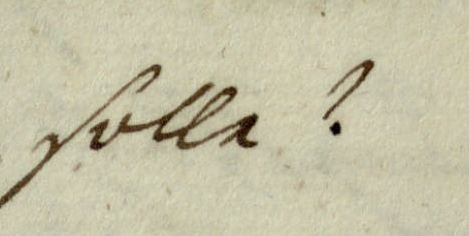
solle?
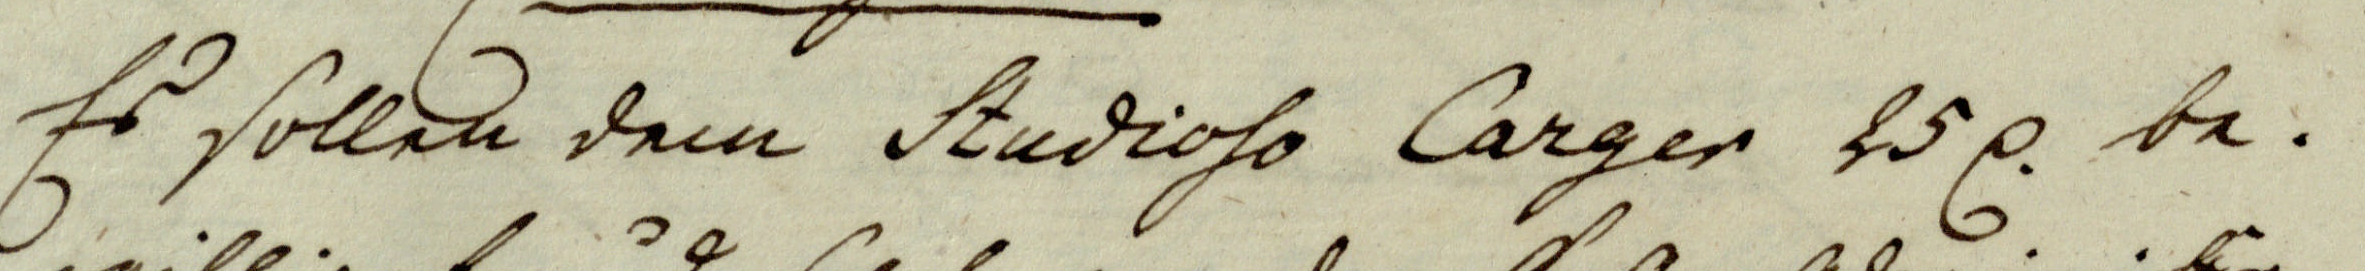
Es sollen dem Studioso Carger 25 l. be¬.
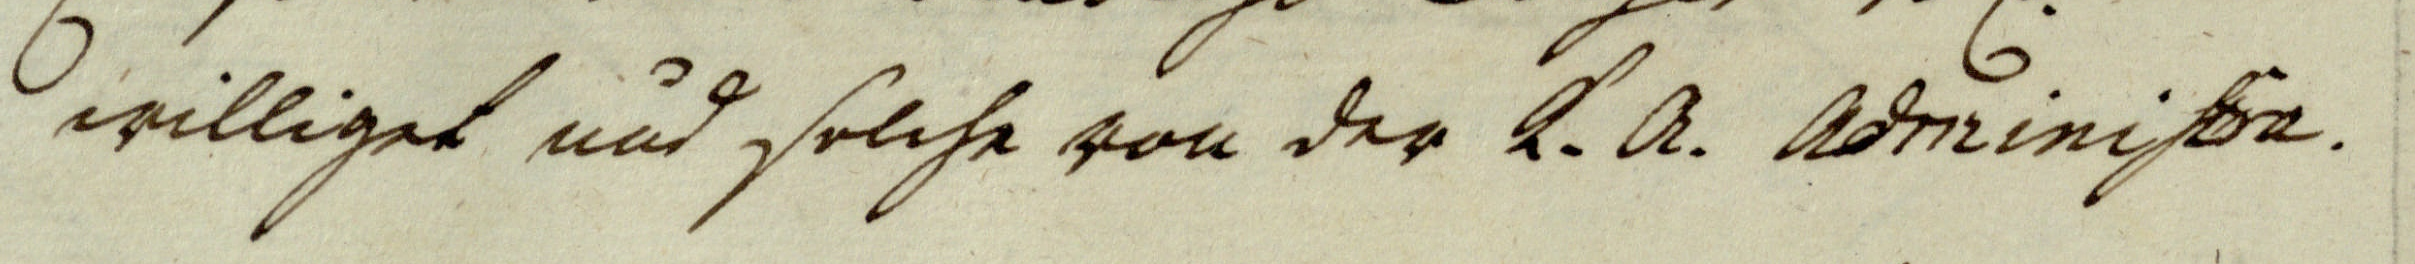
williget und solche von der K. A. Administra¬
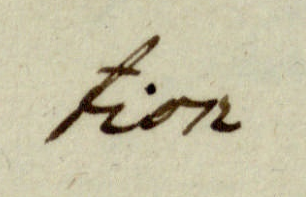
tion
